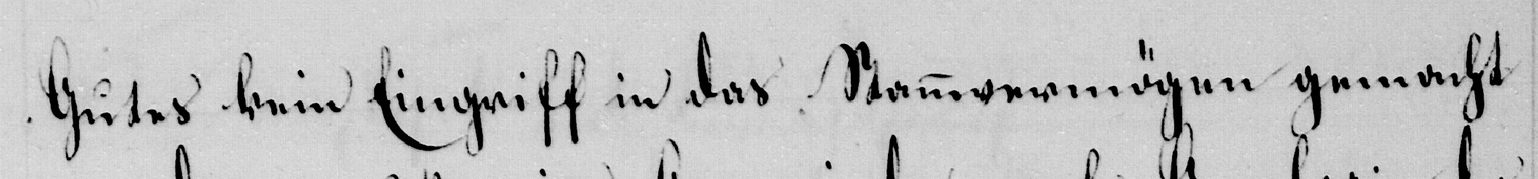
Gutes kein Eingriff in das Stammvermögen gemacht
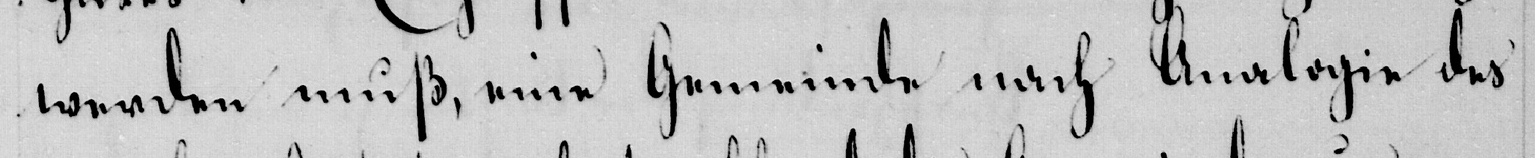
werden muß, eine Gemeinde nach Analogie des
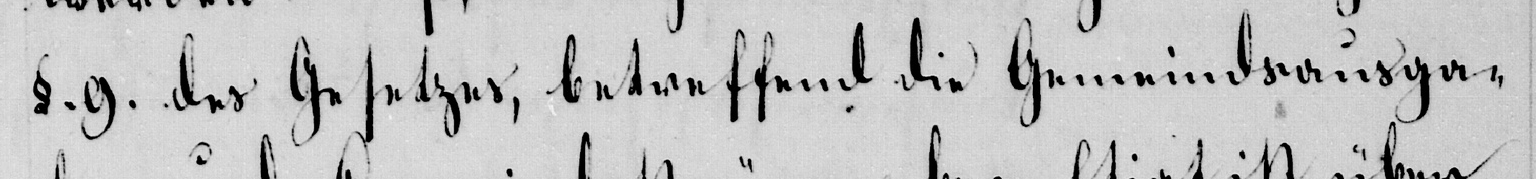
§. 9. des Gesetzes, betreffend die Gemeindsausga¬
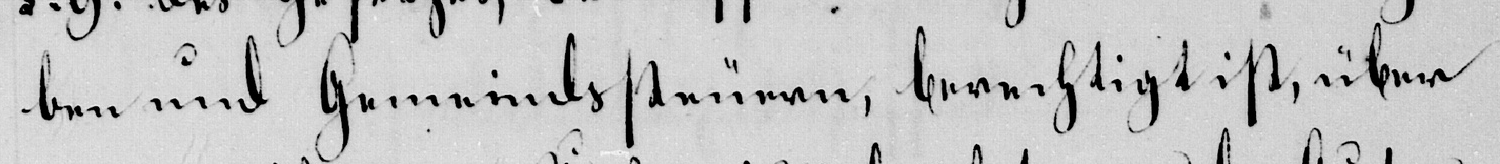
ben und Gemeindssteuern, berechtigt ist, über
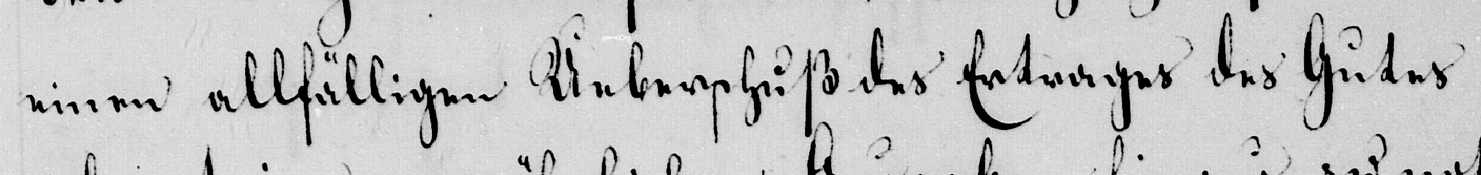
einen allfälligen Ueberschuß des Ertrages des Gutes
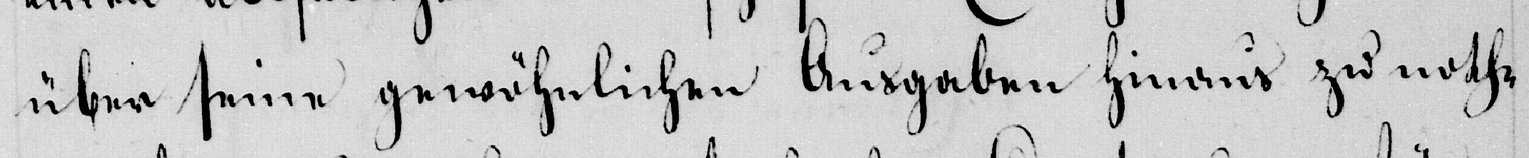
über seine gewöhnlichen Ausgaben hinaus zu noth¬
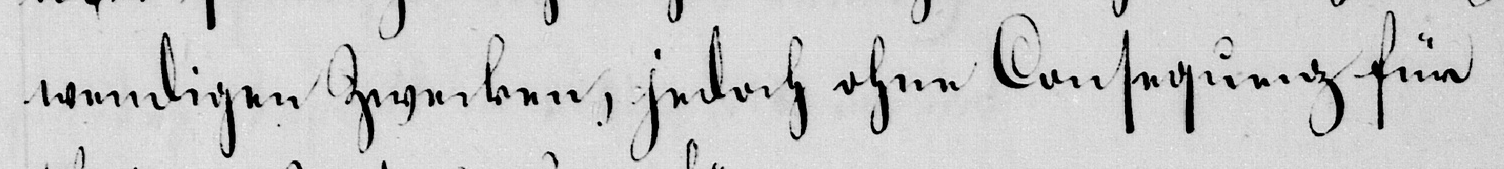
wendigen Zwecken, jedoch ohne Consequenz für
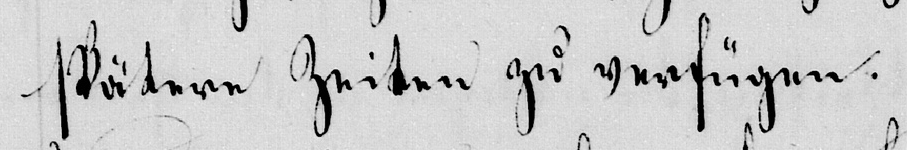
spätere Zeiten zu verfügen.
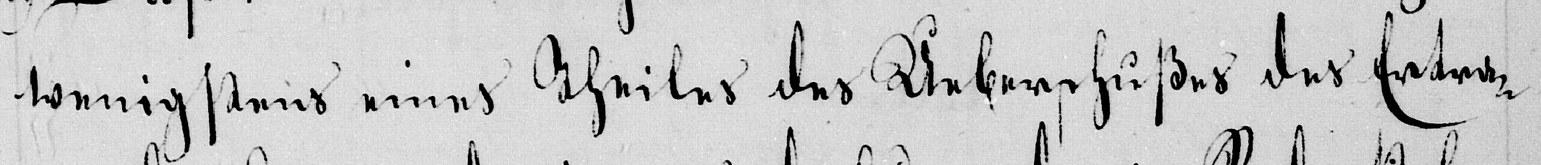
wenigstens eines Theiles des Ueberschußes des Ertra¬
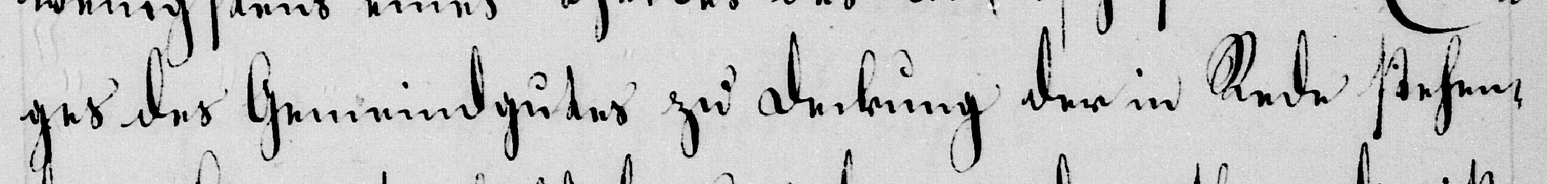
ges des Gemeindgutes zu Deckung der in Rede stehen¬
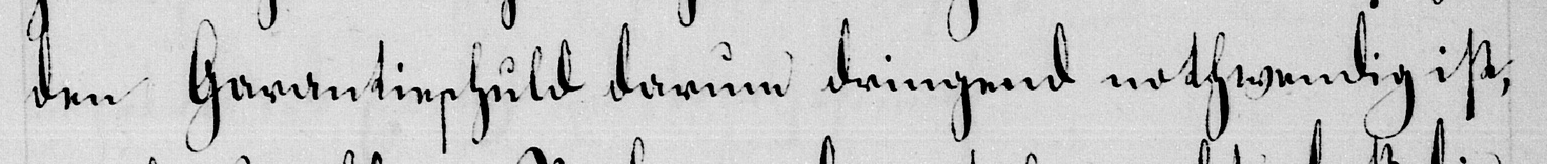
den Garantieschuld darum dringend nothwendig ist,
